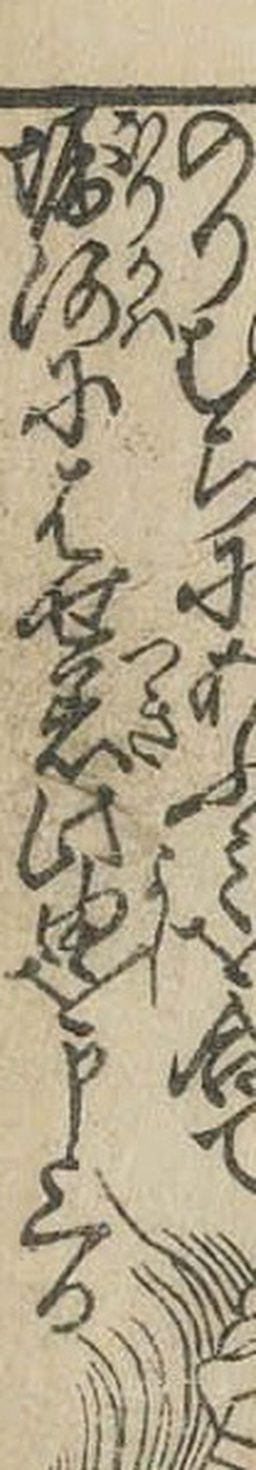堀河にはせ着此由を申上る

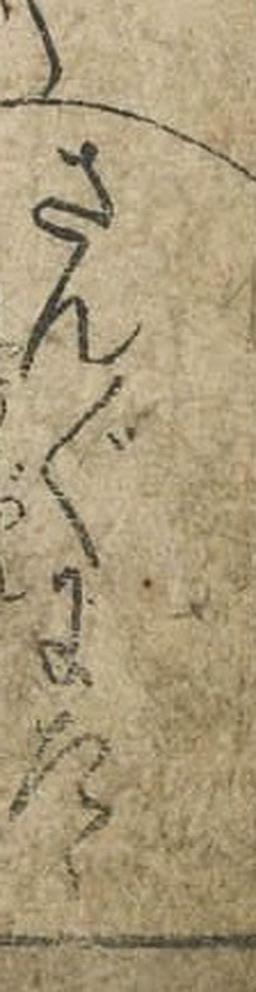さん〴〵にたゝ
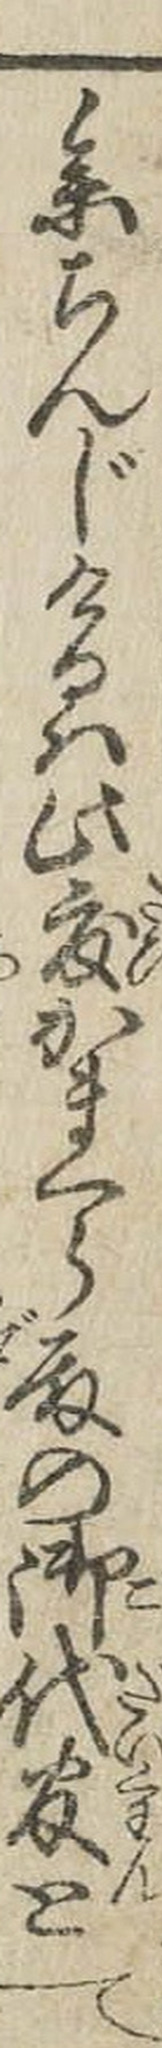参ちんじけるは此度かまくら殿の御代官と
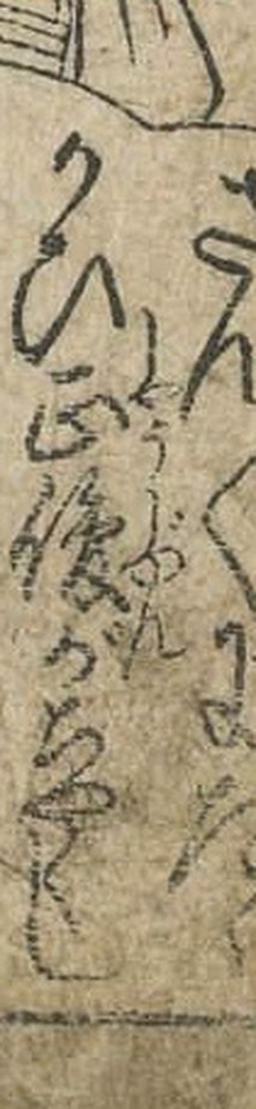かひ正俊がちやくし
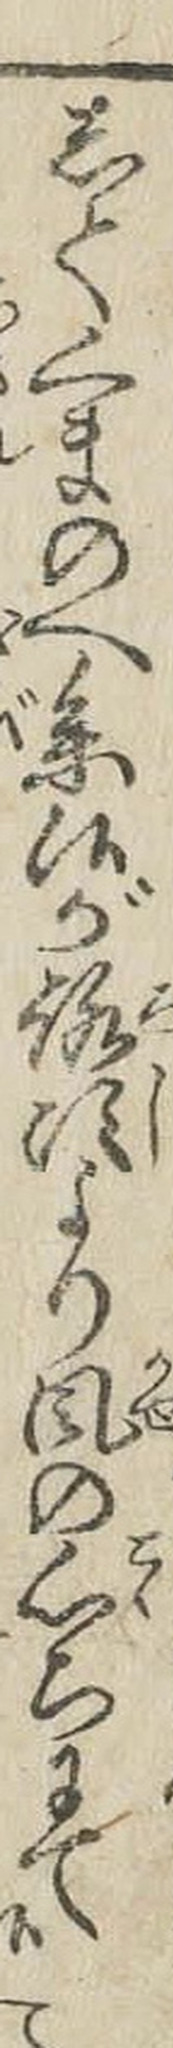してくまのへ参候が路次より風の心ちにて候
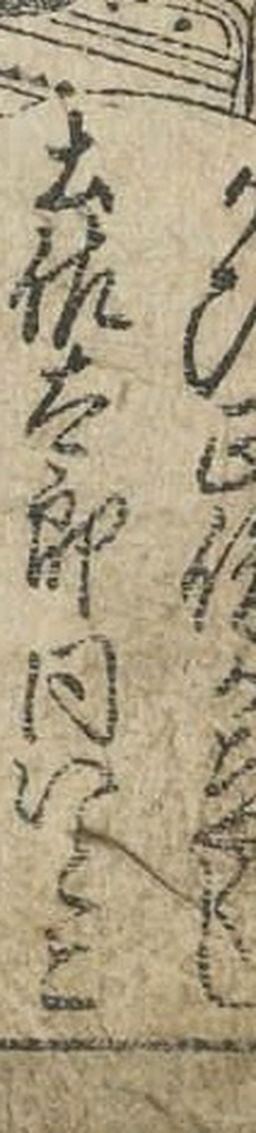土佐太郎同いとこ
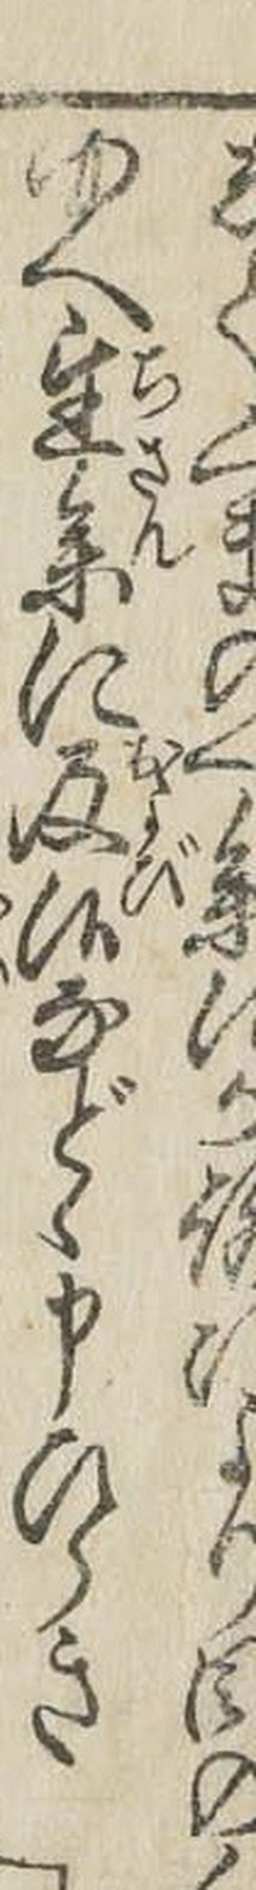ゆへ遅参に及候などゝ申ひらき
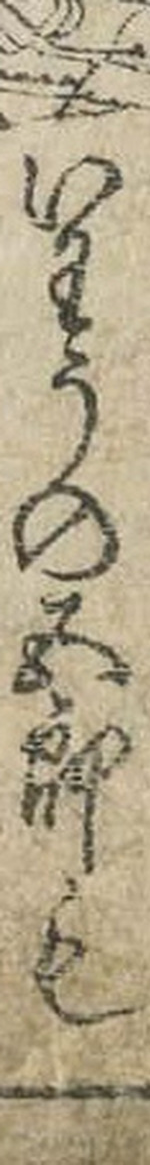いわうの五郎も
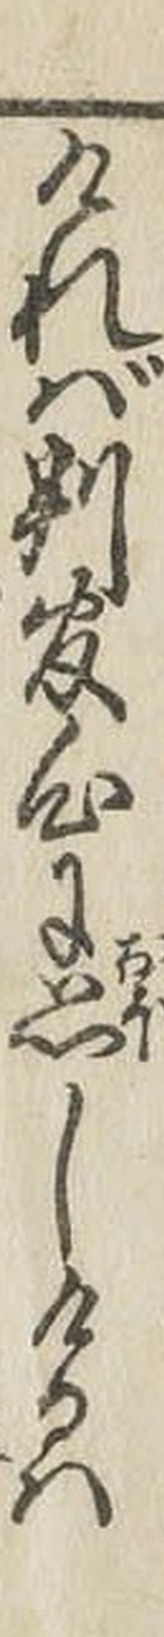ければ判官心に思しけるは
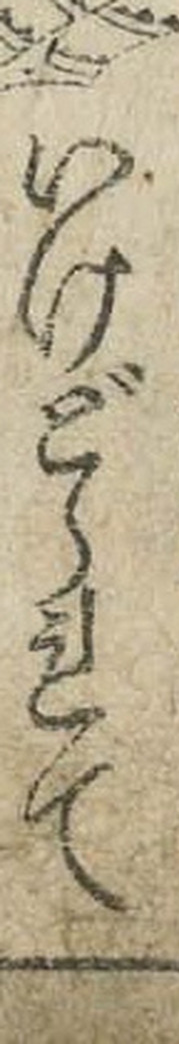いけどられて
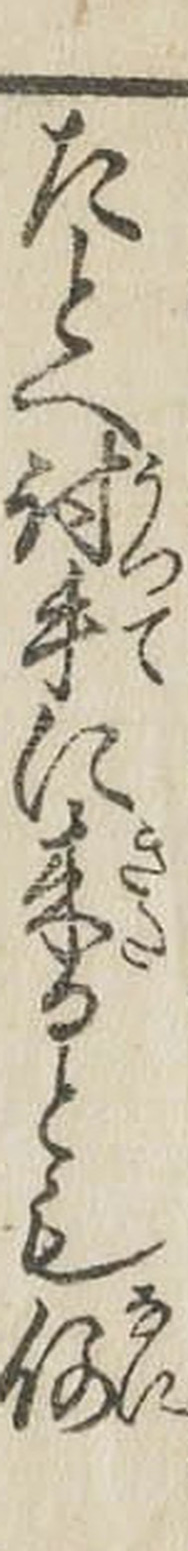たとへ討手に来るとも何
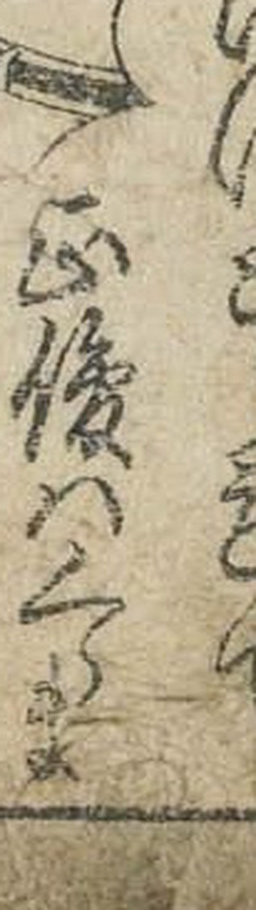正俊はくらま
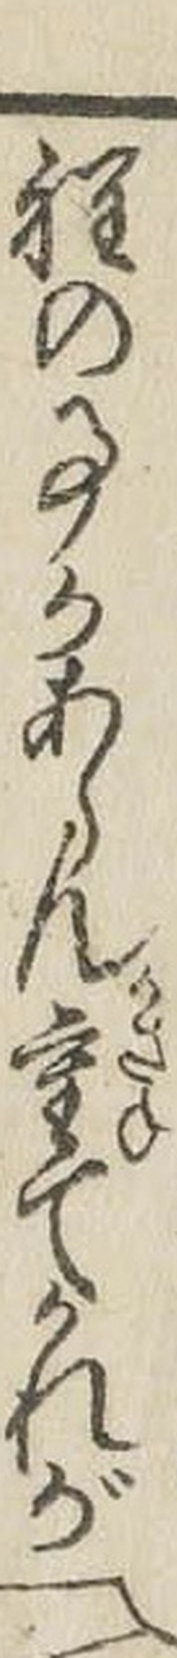程の事かあらん重てかれが
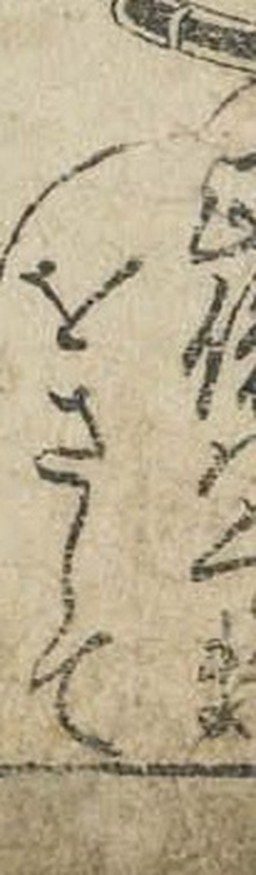をさして
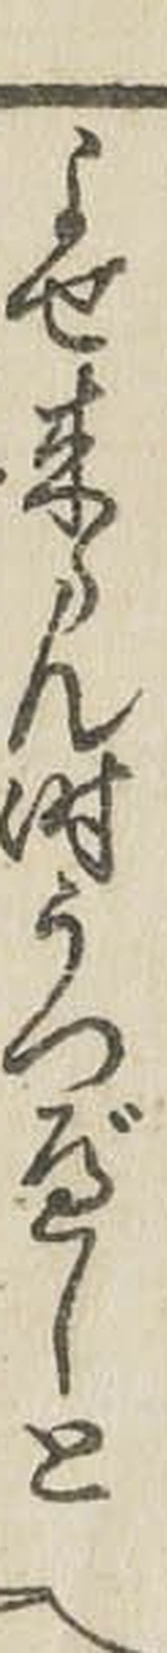よせ来らんときうつべしと
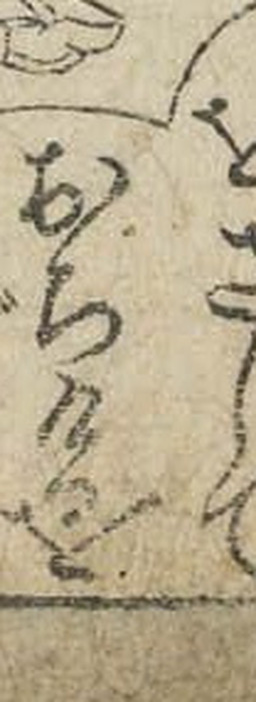おちけるを
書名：絵本写宝袋 9巻 3之巻
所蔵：東京学芸大学教育コンテンツアーカイブ
